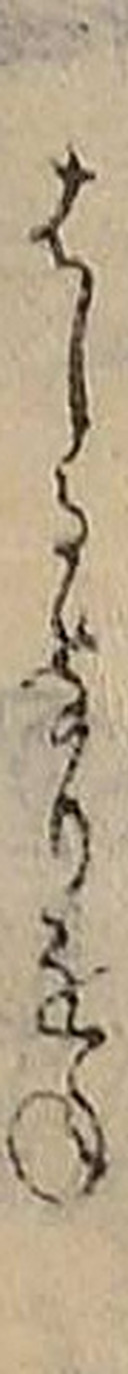はしるなり近年
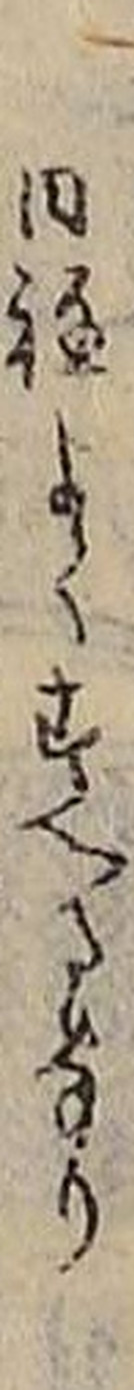日程よくすへるなり
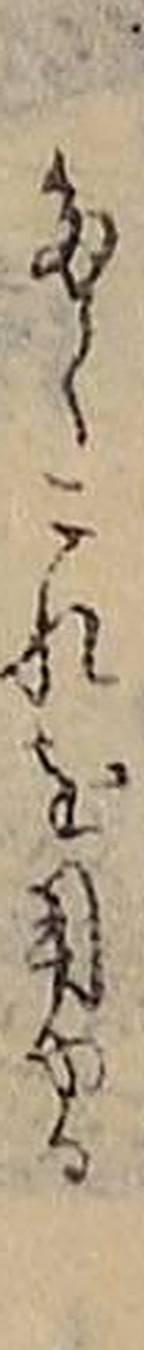多くこれを用ゆる
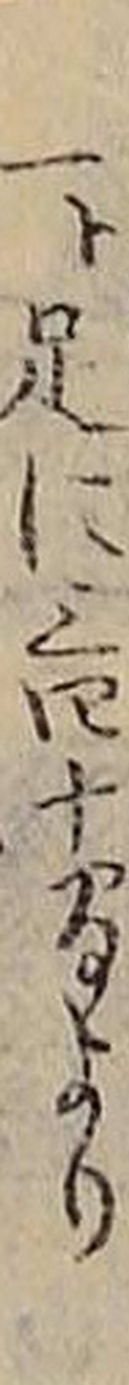一足に三四十間より
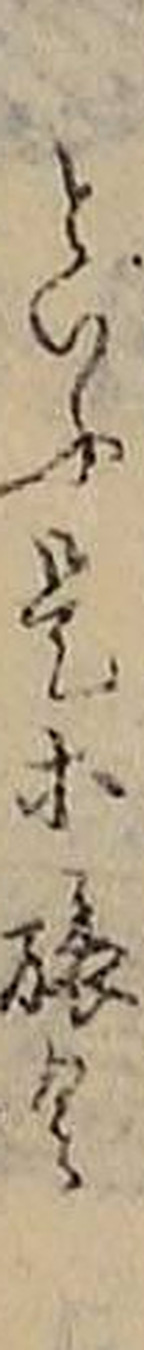といふ是等旅具
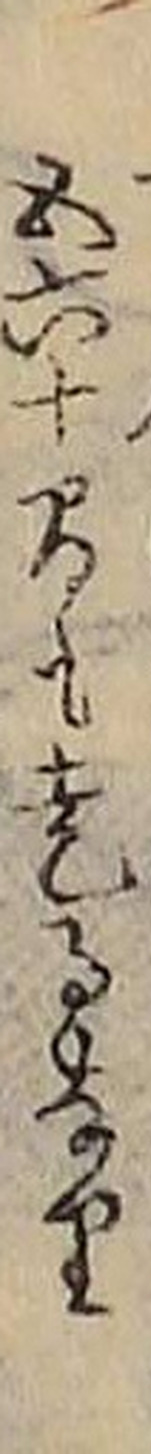五六十間も走るなり
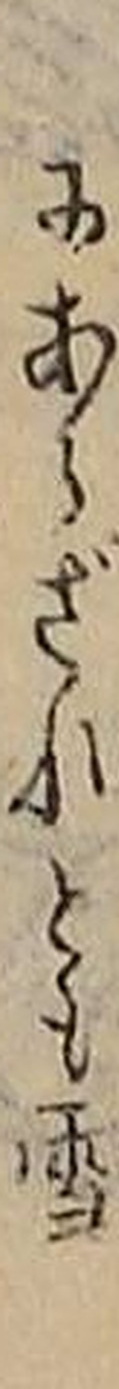にあらざれとも雪
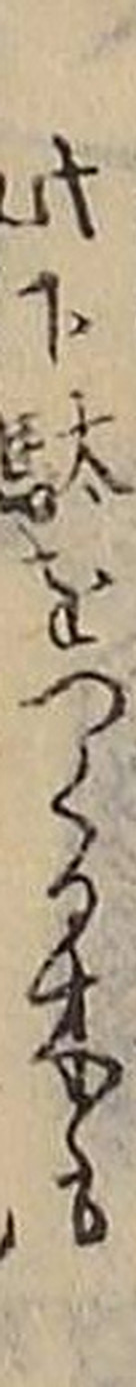此下駄をつくる木も
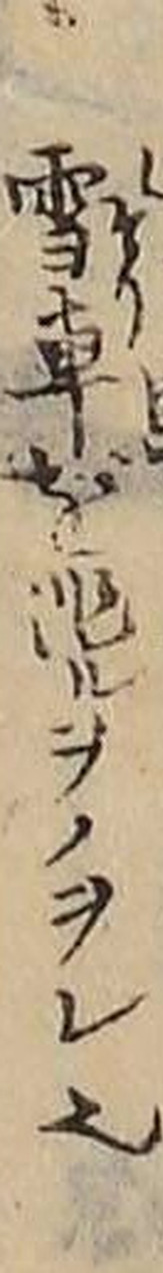雪車を作ヲノヲレ也
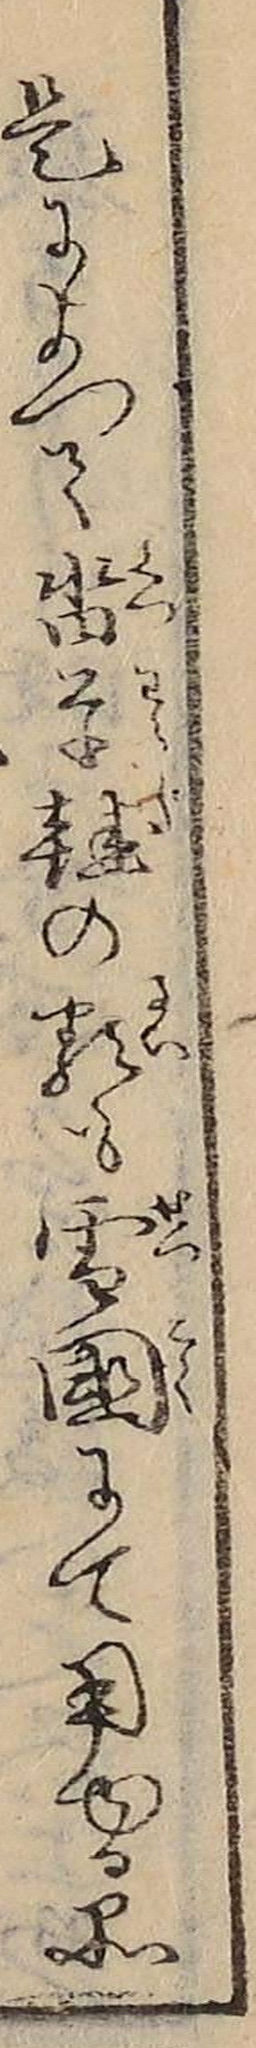是によつて沓草鞋の類も雪国にて用ゆる品
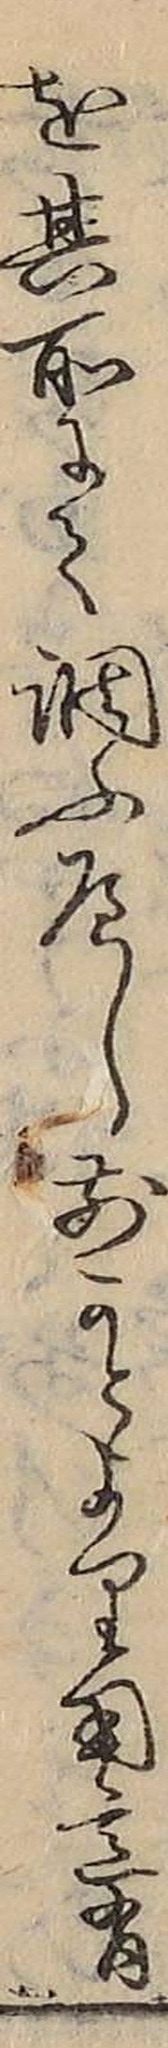を其所にて調ふへし前かとより用意有
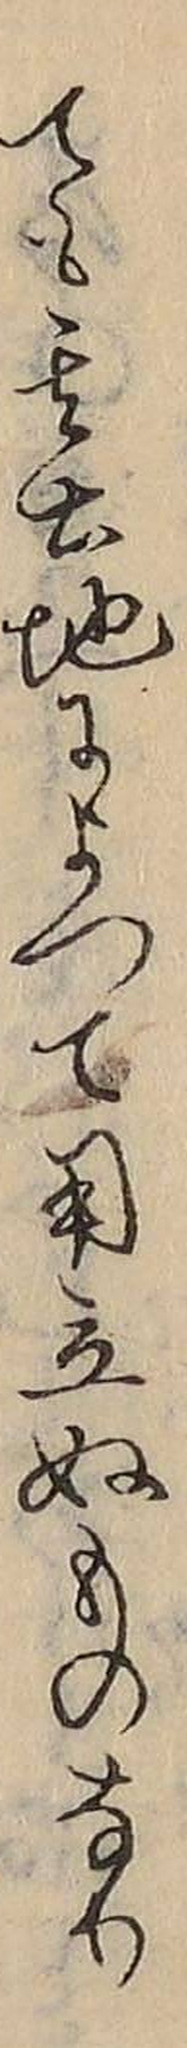ても其土地によつて用立ぬものなり
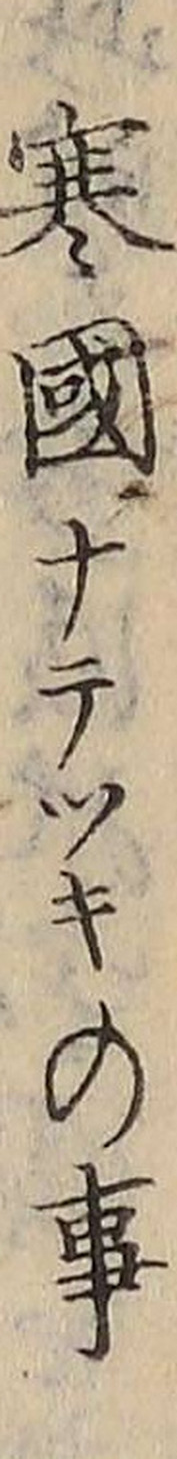寒国ナテツキの事
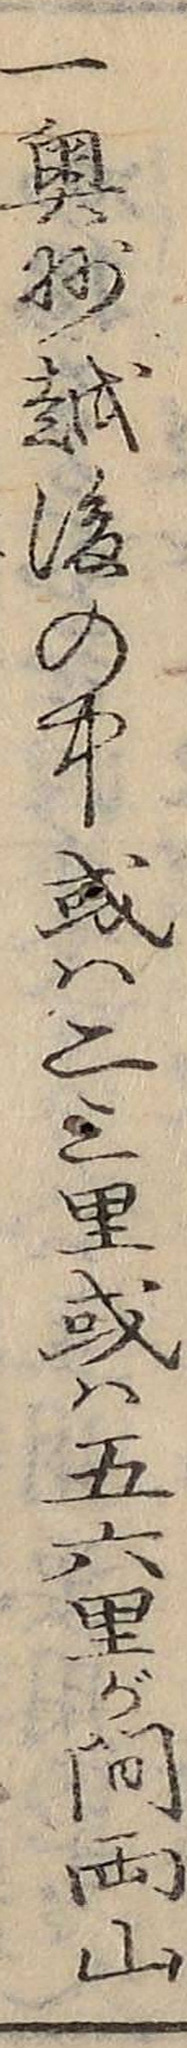一奥州越後の中或は二三里或は五六里が間両山
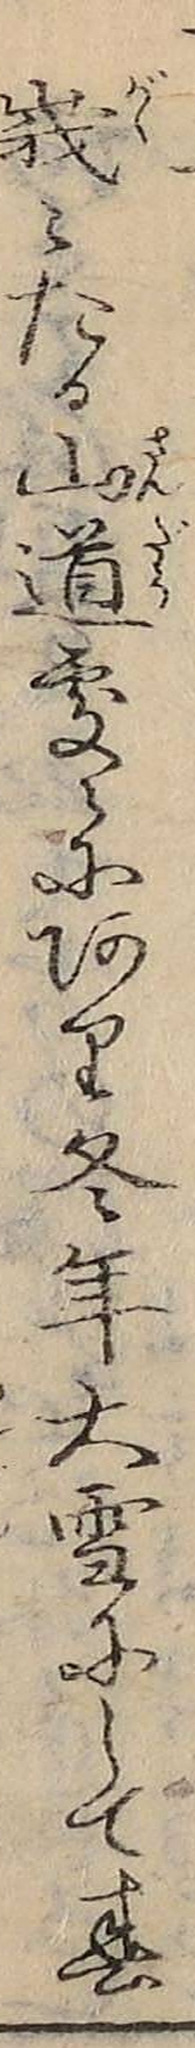峨々たる山道処々にあり冬年大雪にして春
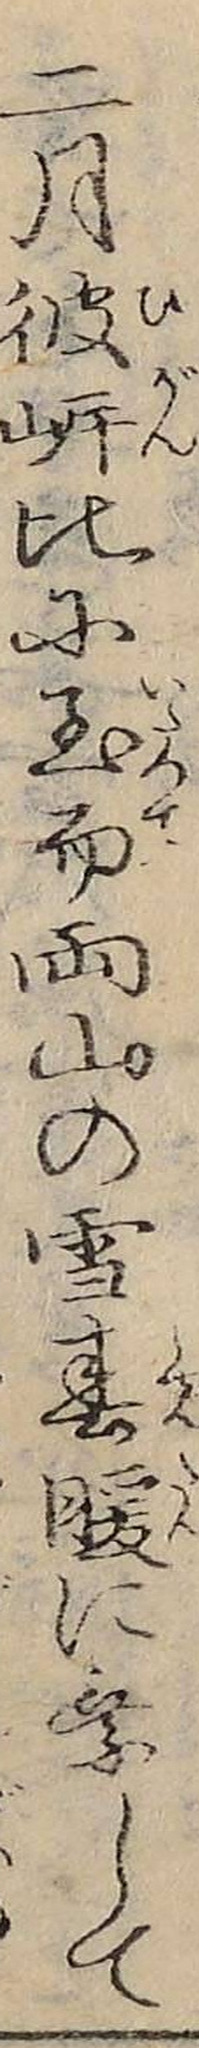二月彼岸比に至而両山の雪春暖に乗して
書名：旅行用心集
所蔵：神戸大学附属図書館 国文学研究資料館
